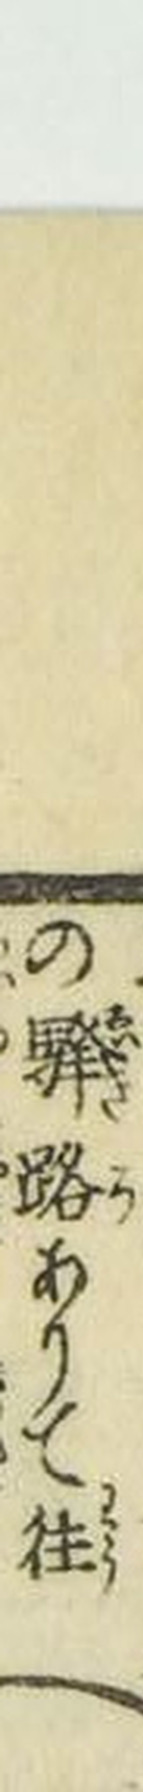の驛路ありて往
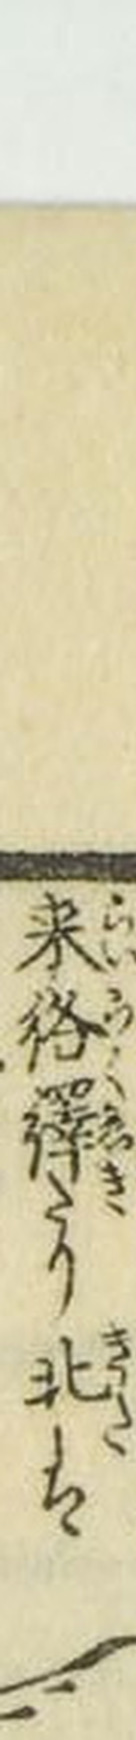来絡驛たり北は
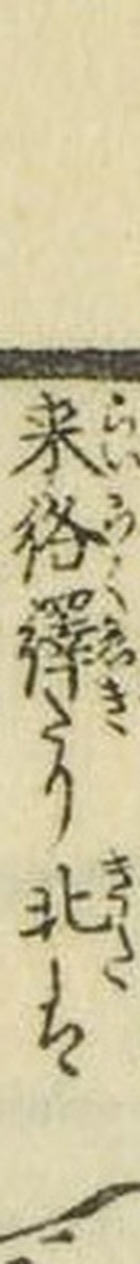来絡驛たり北は
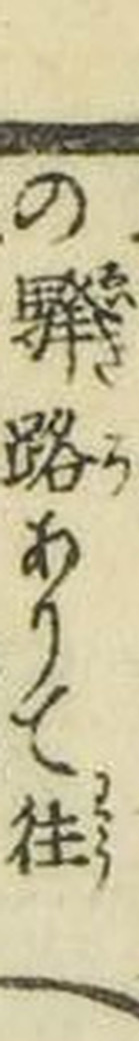の驛路ありて往
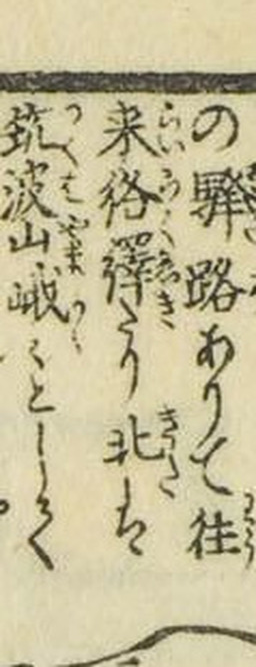来絡驛たり北は
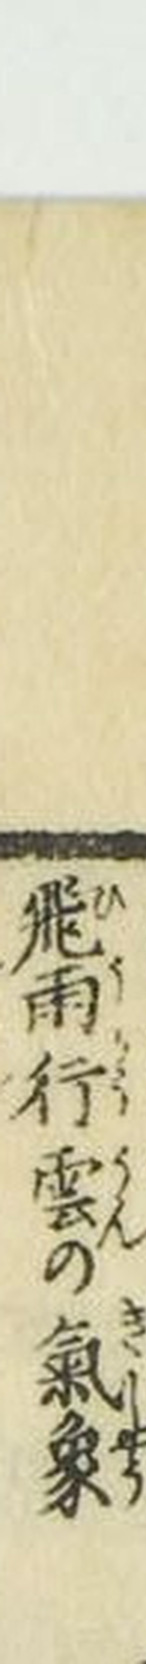飛雨行雲の氣象
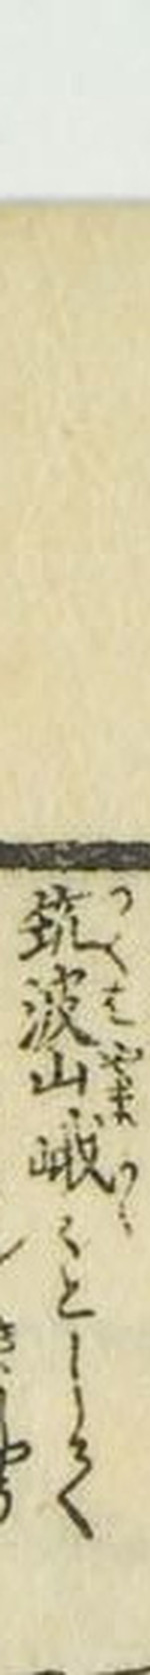筑波山峨々として
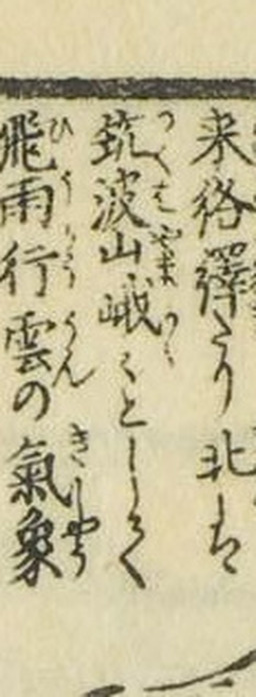筑波山峨々として
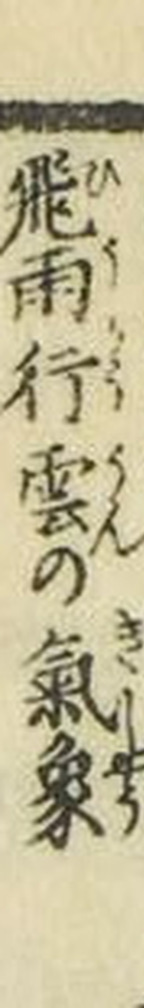飛雨行雲の氣象
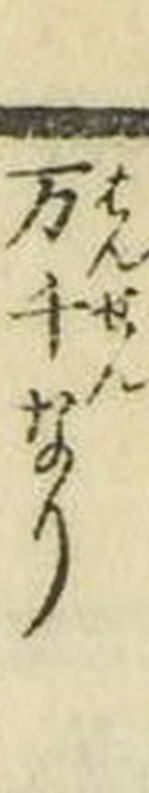万千なり
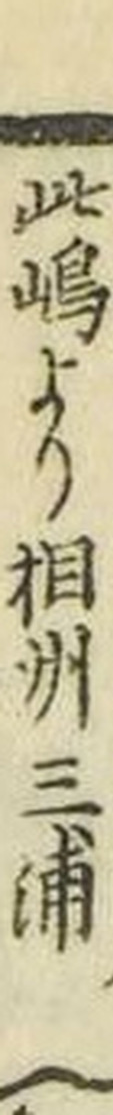此嶋より相州三浦
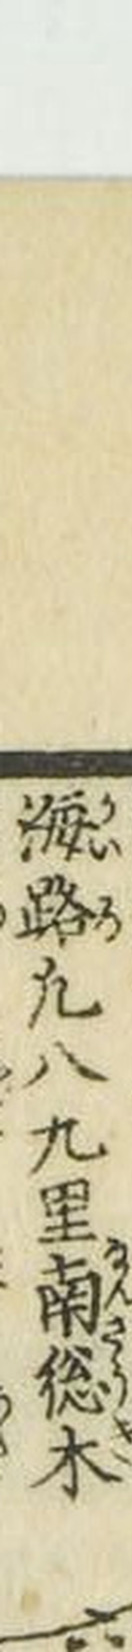海路凡八九里南総木
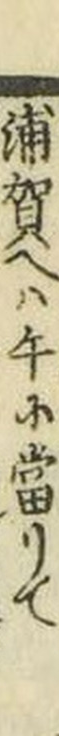浦賀へは午に當りて
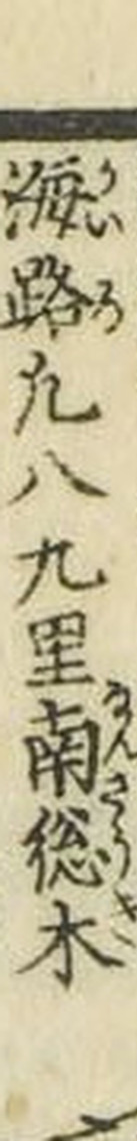海路凡八九里南総木
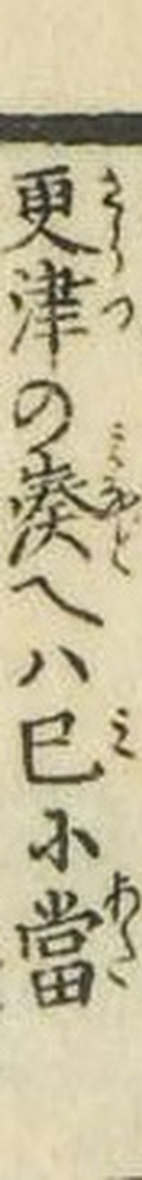更津の湊へは巳に當
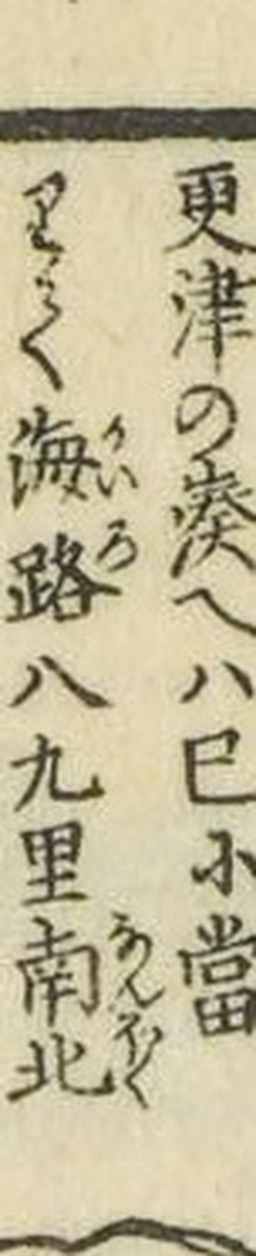りて海路八九里南北
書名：江戸名所図会 20巻 巻之4
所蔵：東京学芸大学教育コンテンツアーカイブ
